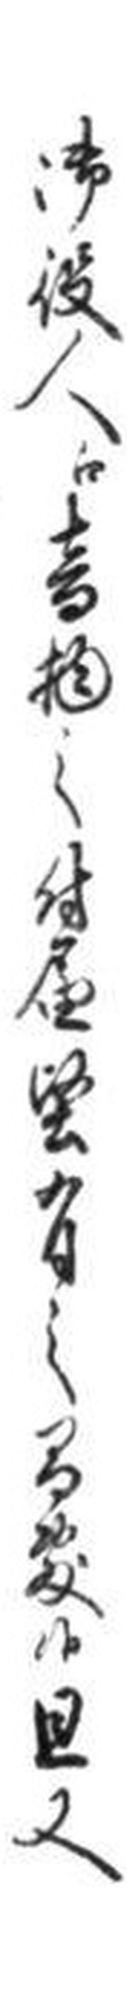御役人江音物之付届堅有之間敷候且又
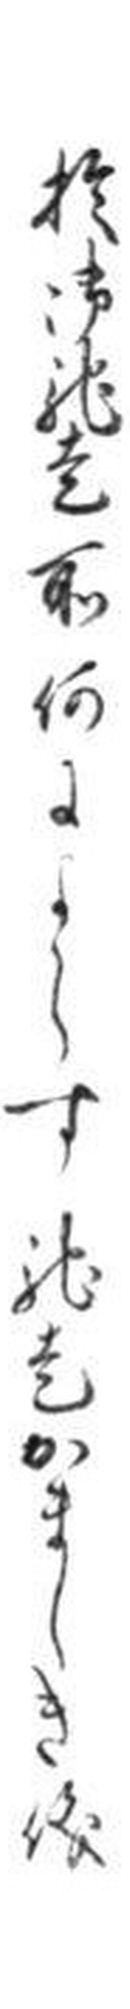於御馳走所何によらす馳走かましき儀
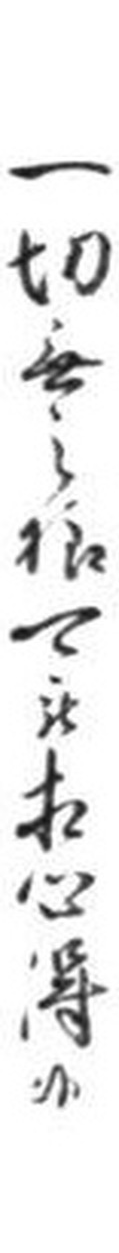一切無之様可被相心得候
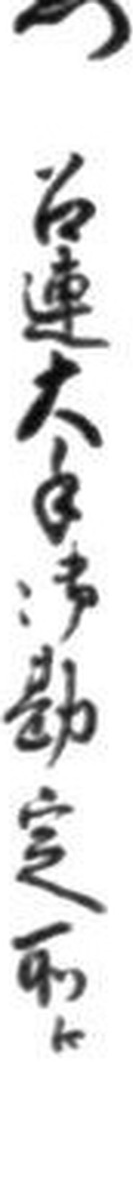看持参大手御勘定所江
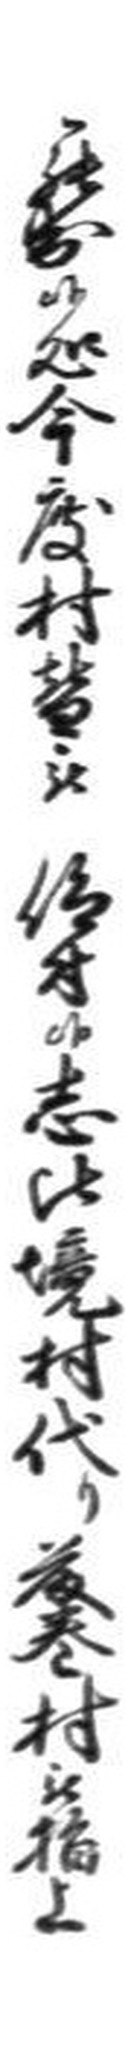罷出候処今度村替被仰付候志比境村代り藤巻村被指上
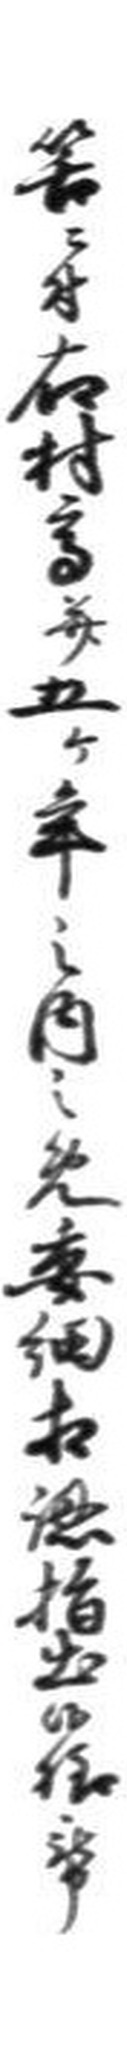筈ニ付右村高并五ケ年之内之免委細相認指出候様被申
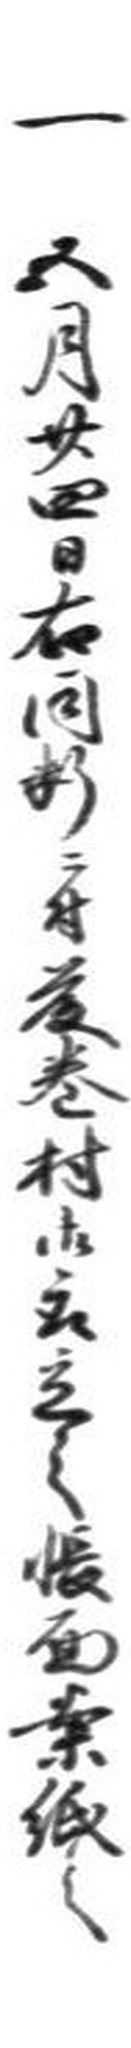一五月廿四日右同断ニ付藤巻村御取立之帳面案紙之
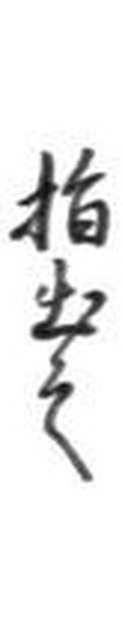指出之
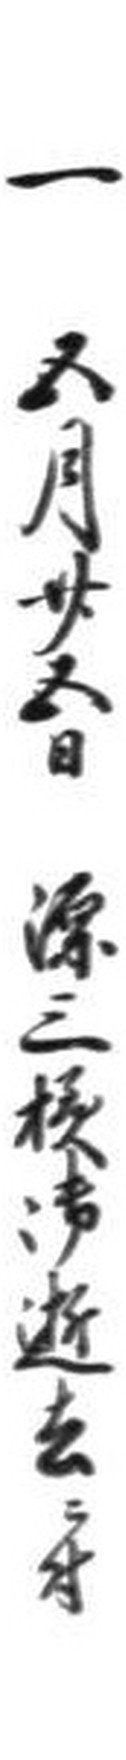一五月廿五日源三様御逝去ニ付

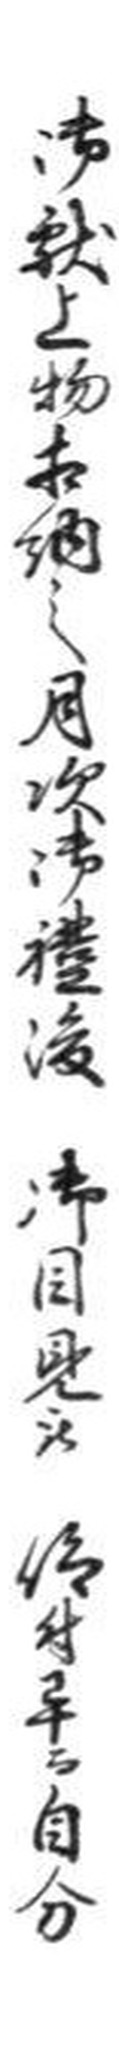御献上物相納之月次御礼後御目見被仰付畢而自分
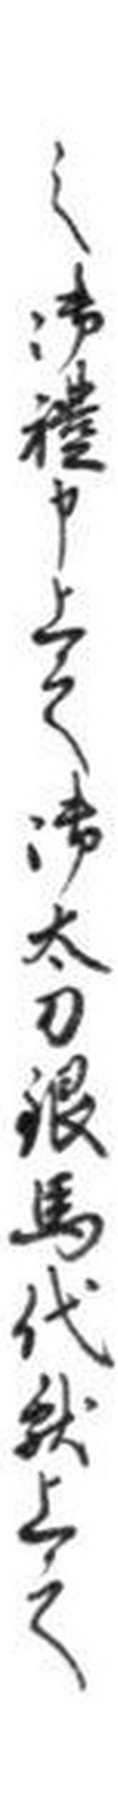之御礼申上之御太刀銀馬代献上之
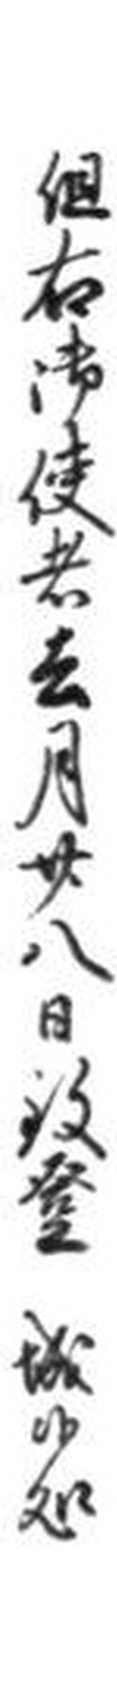但右御使者去月廿八日致登城候処
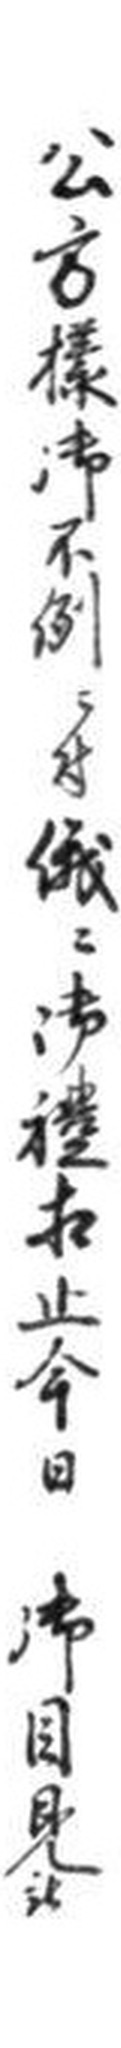公方様御不例ニ付俄ニ御礼相止今日御目見被
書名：家譜 三十三 吉邦公 享保四年
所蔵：福井県文書館 Fukui Prefectural Archives
